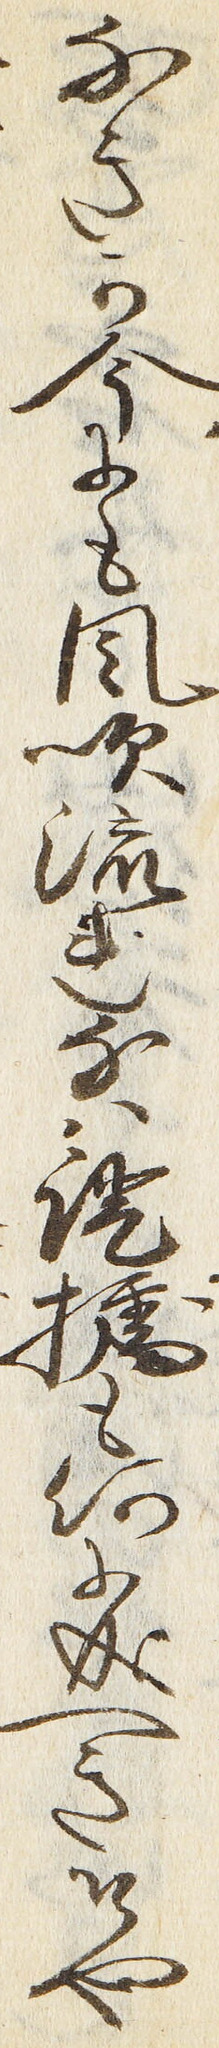なきか今にも風吹流れなは証拠も何に成へきそや
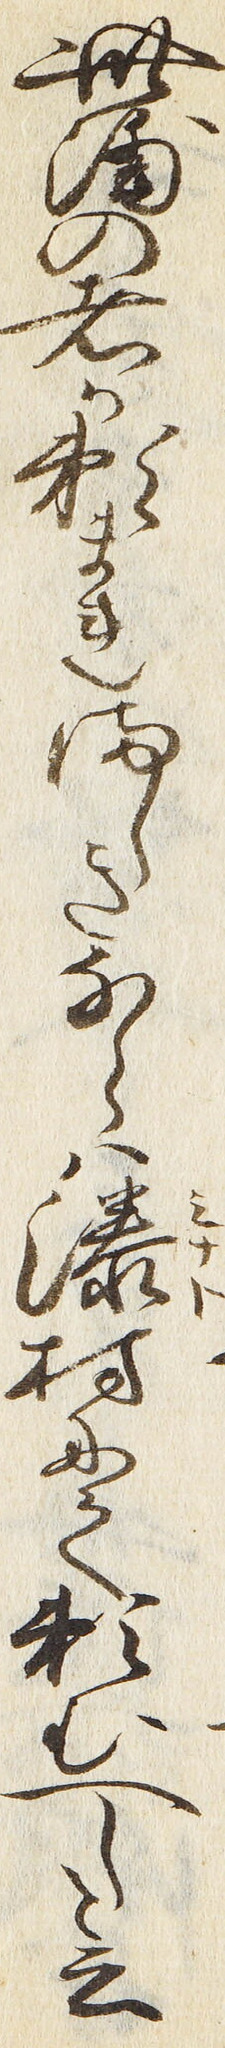此浦の者か頼まれましきならハ湊村にて頼むへしと云
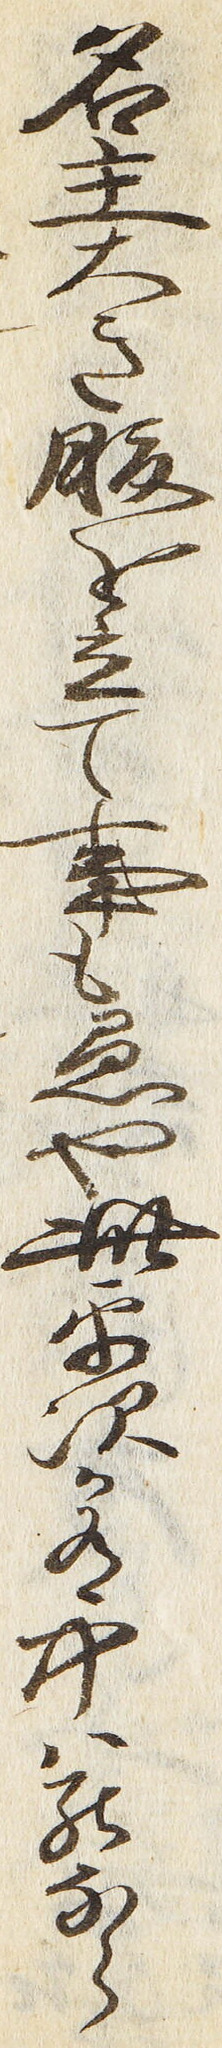名主大き腹を立て事も急也此平次か有中は罷なら
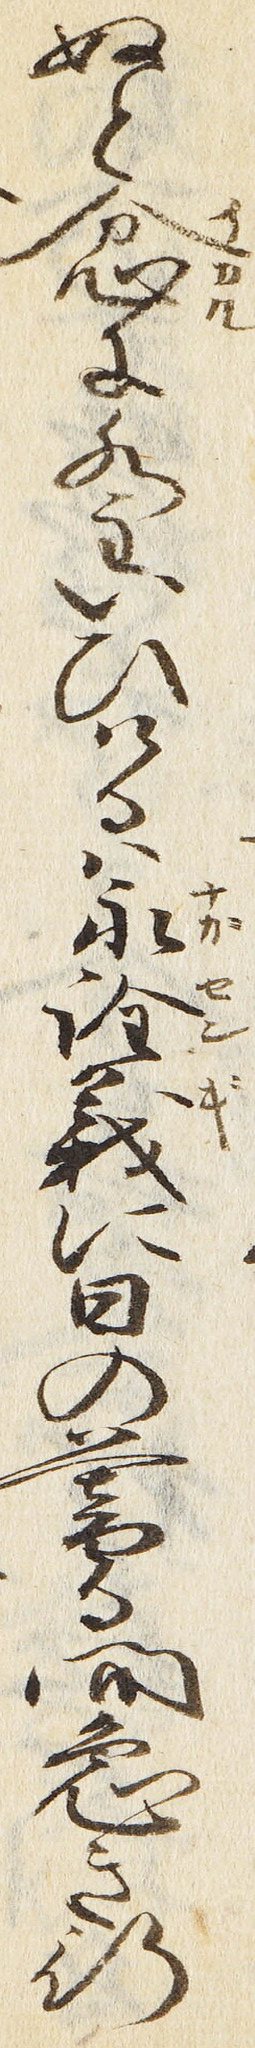ぬと忿に水主いひけるは永詮義に日の暮る間急き行
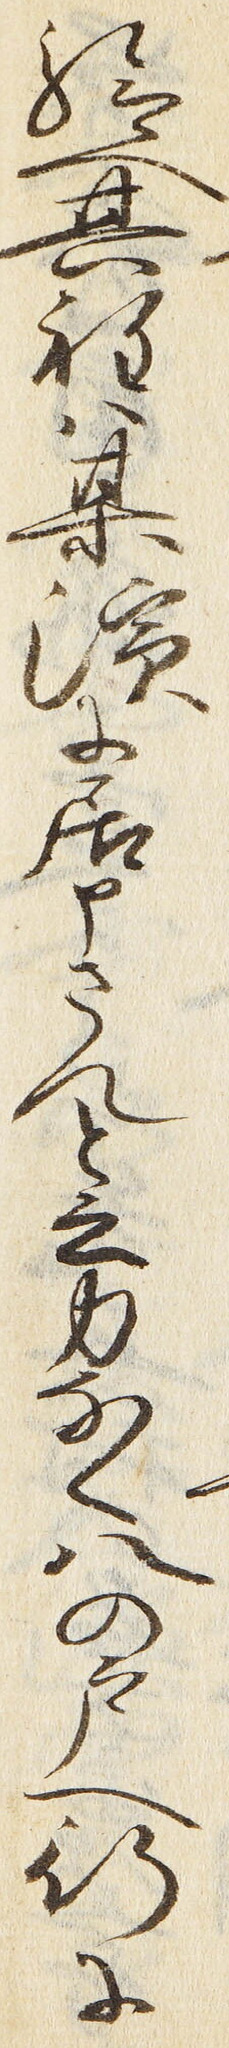給へ其程ハ某浜に居申さんと云力なく八の戸へ行に
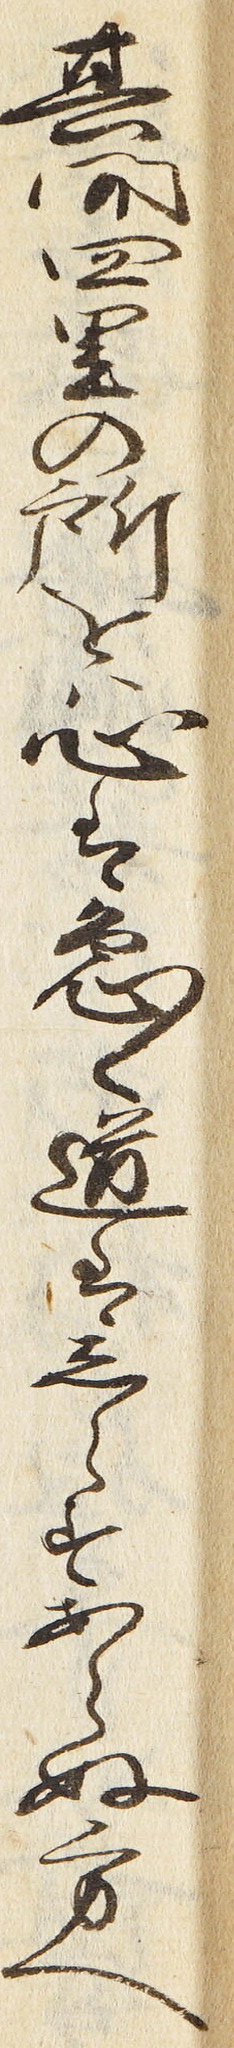其間四里の所をは心は急く道はしらすあらぬ方へ
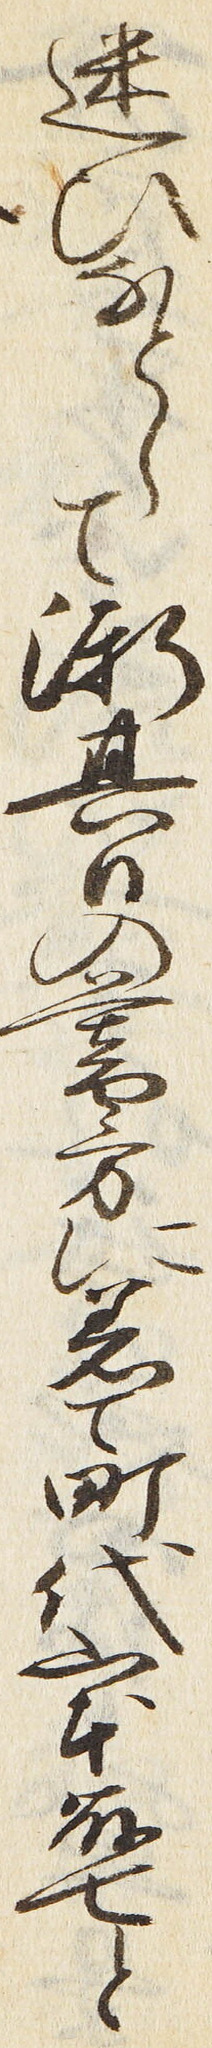迷ひなとして漸其日の暮方に着て町代山本藤七と
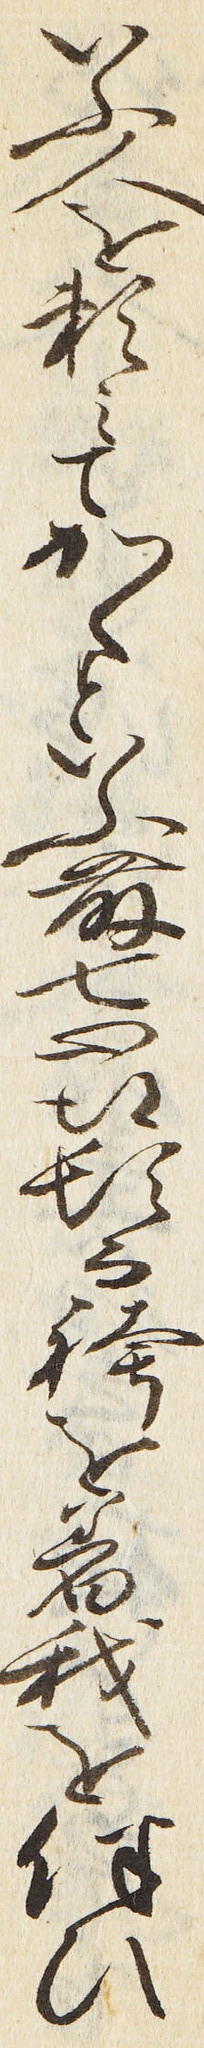いふ人を頼みてかくといふ藤七心得頓而袴を着我を伴ひ
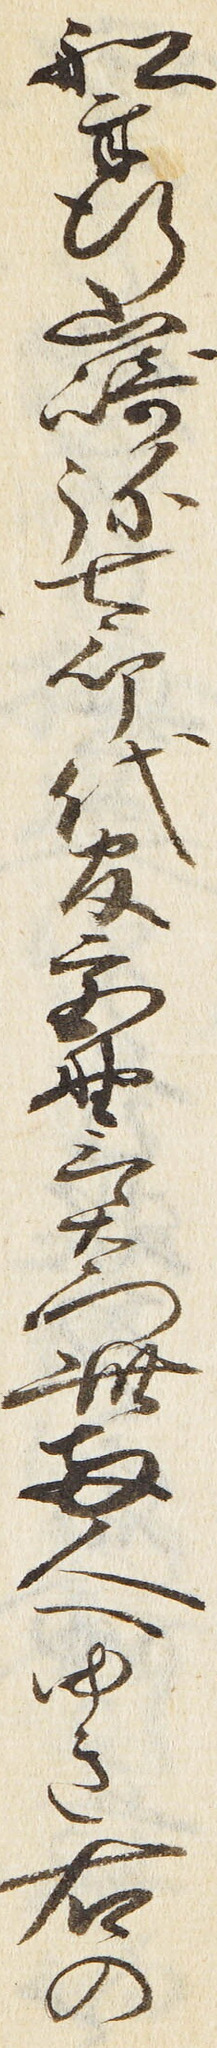船奉行山崎弥七郎代官宮野三郎右衛門此両人へゆき右の
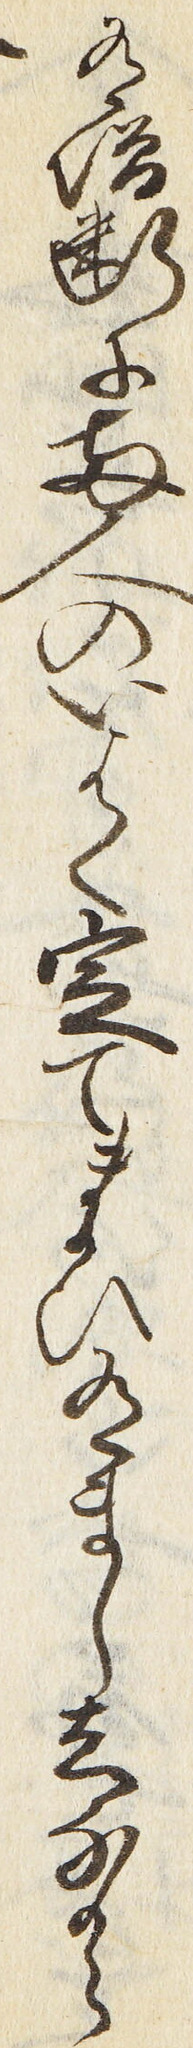有増断に両人のいはく定てまよひ有まし去なから
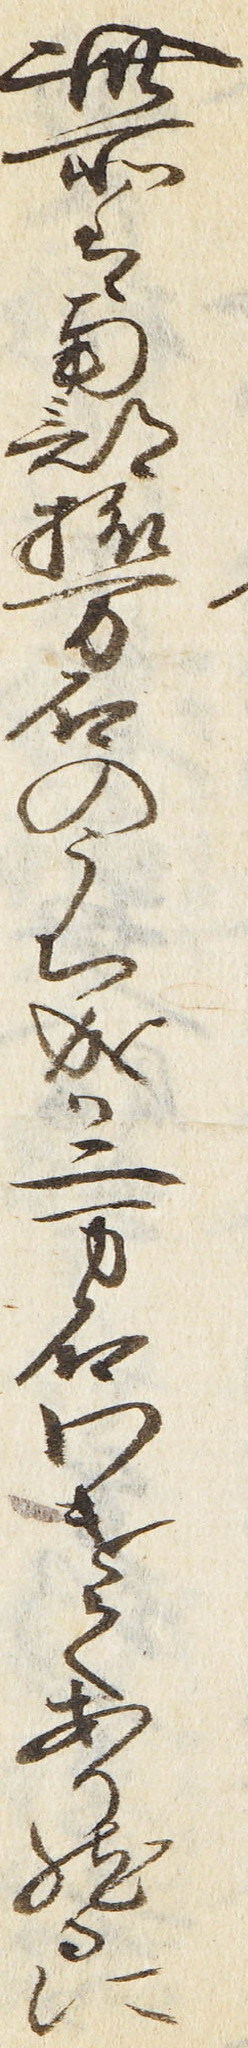此所は南部拾万石のうち成か二万石わけてあり然るに
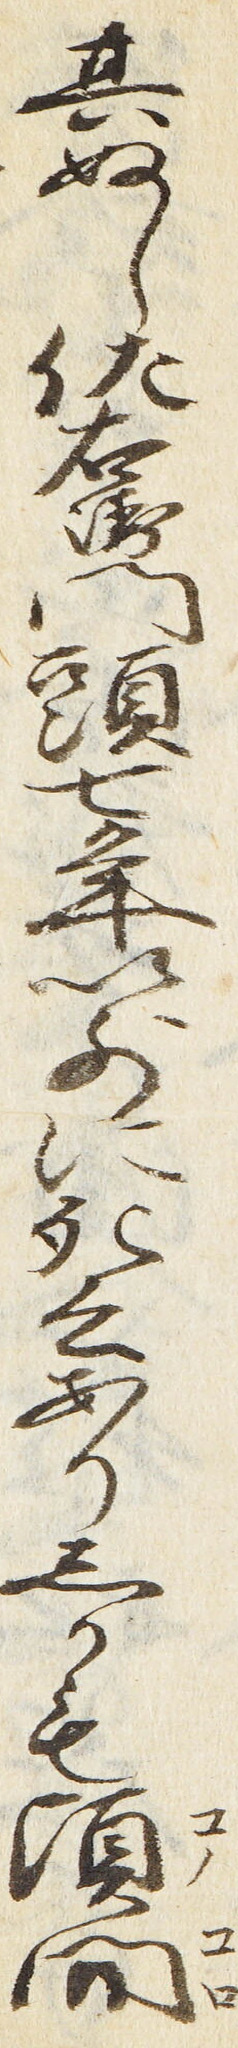其ぬし佐右衛門頭七年以前に死去ありしかも頃間
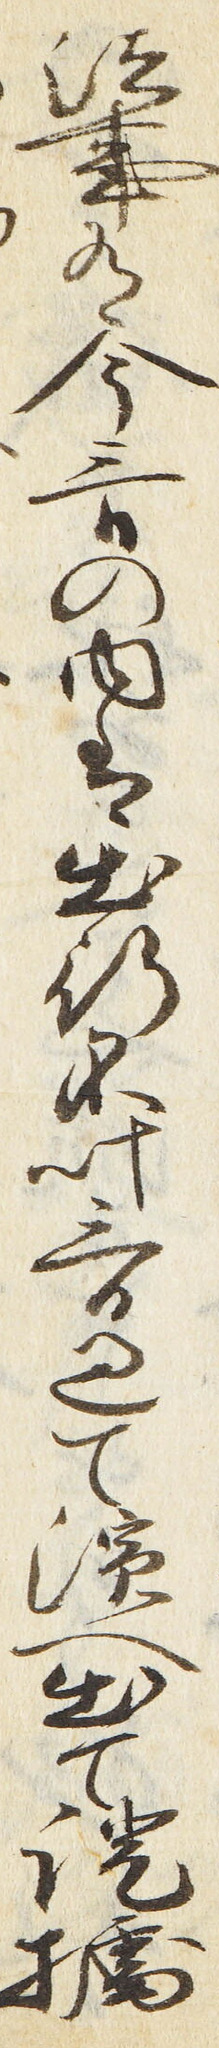法事有今三日の内は出行不叶三日過て浜へ出て証拠
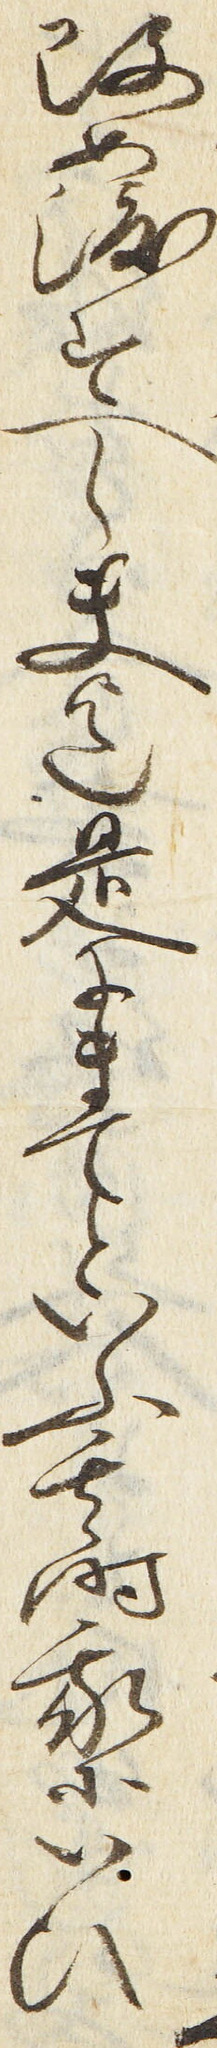改め渡すへし夫迄是にまてといふ其時我等いひ

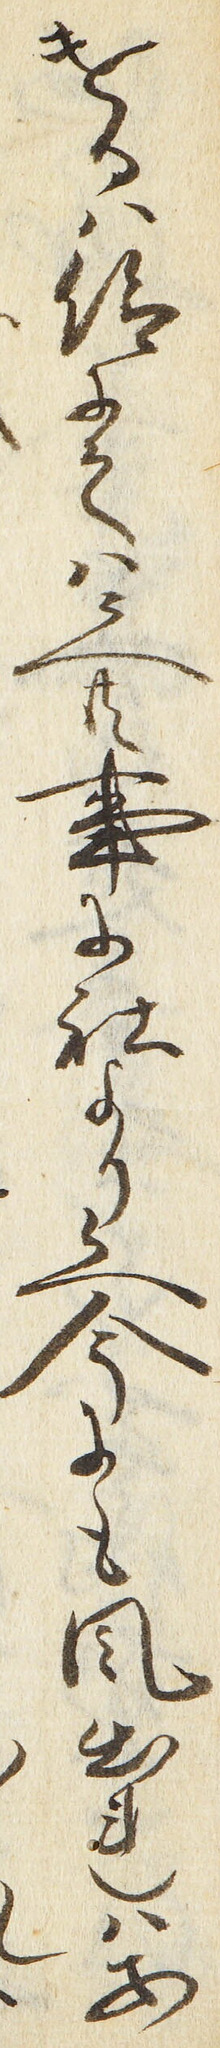けるは仰にては候へ共事に社より候へ今にも風出れはあ
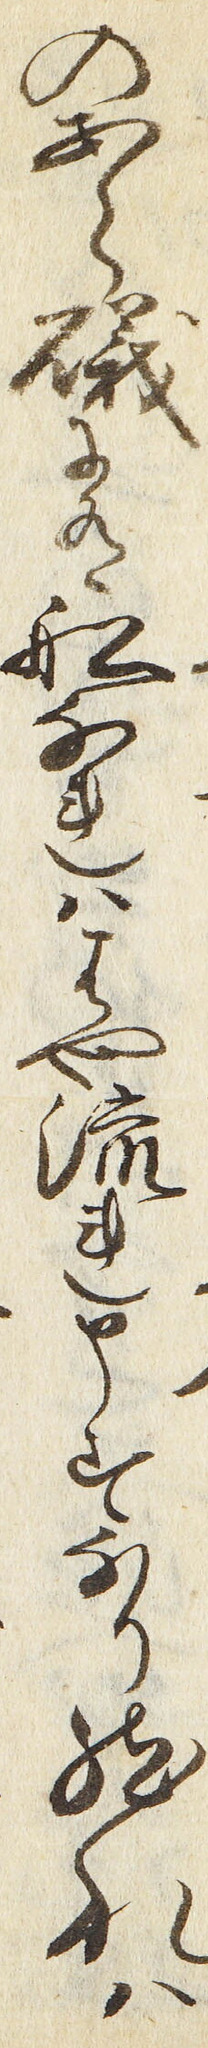のあら磯に有船なれははや流れ申すなり然れは
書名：海陸世話日記
